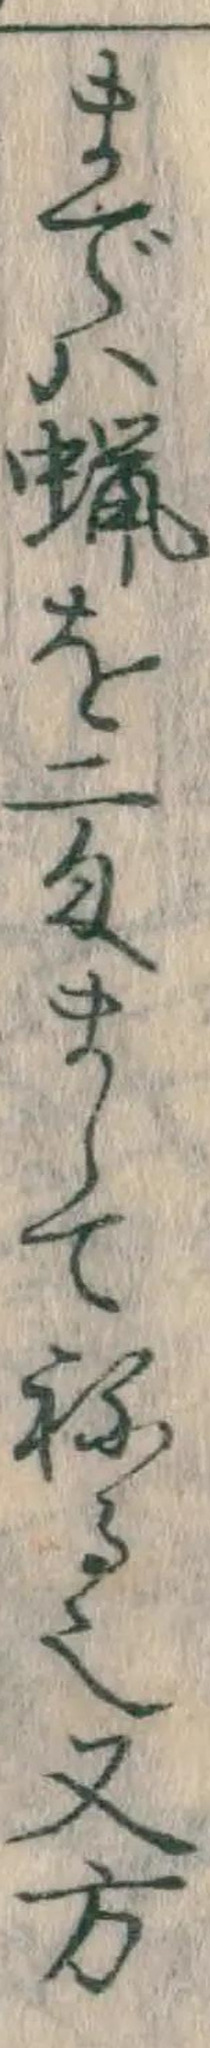までは蠟を二匁ましてねる也又方
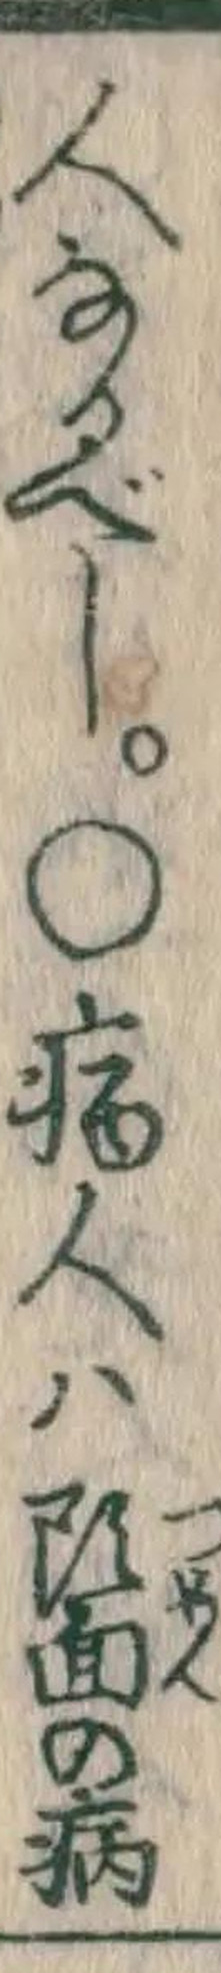人なるべし。○病人は頭面の病
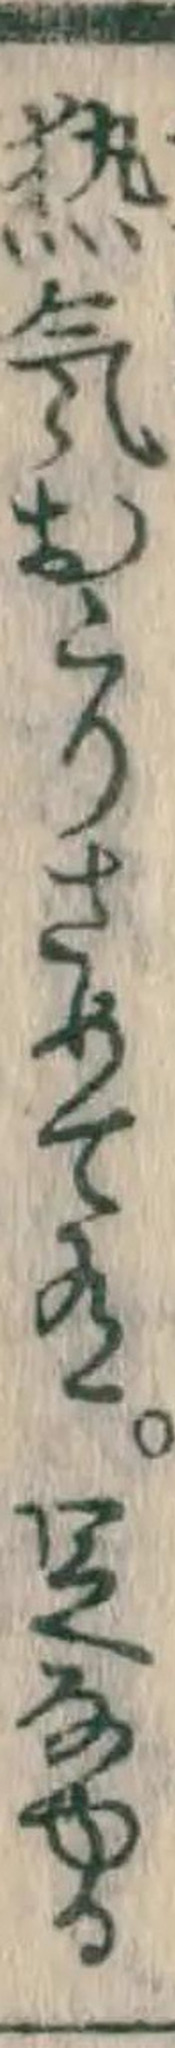熱気おこりさめて有。足なゆる
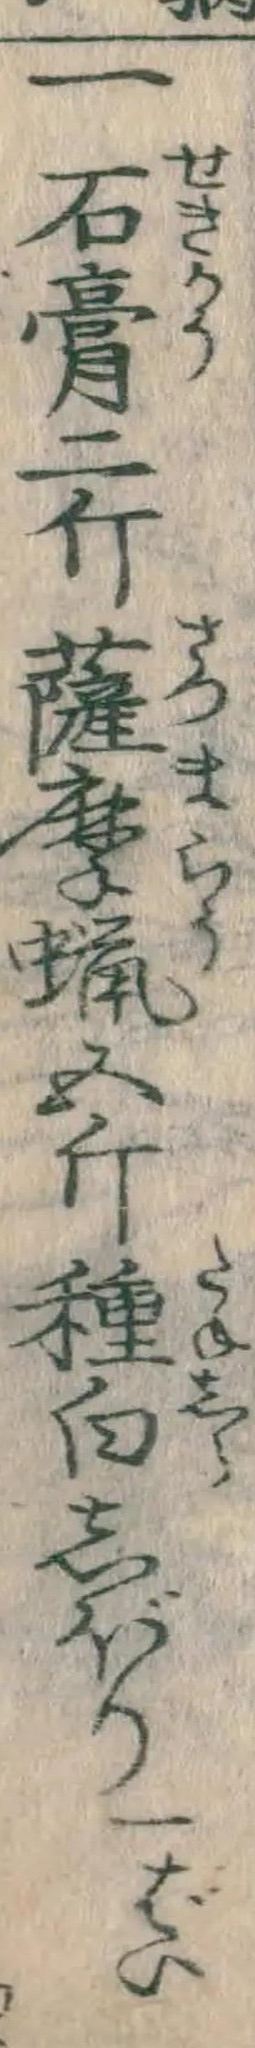一石膏二斤薩摩蠟五斤種白しぼり一ばい
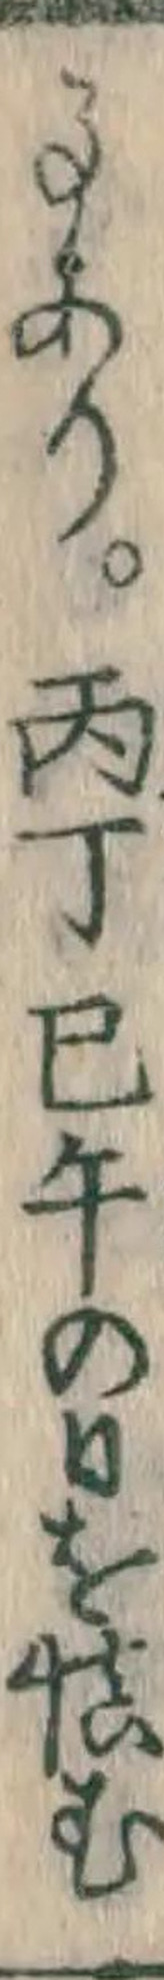事あり。丙丁巳午の日を慎む
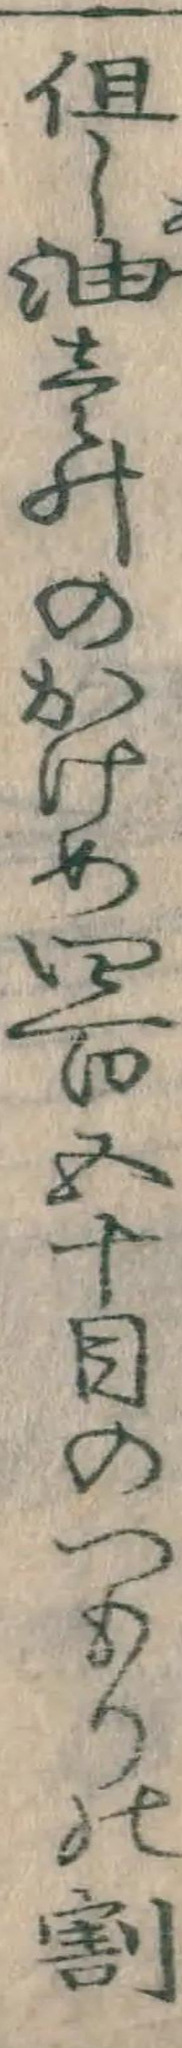但し油壱升のかけめ四百五十目のつもりの割

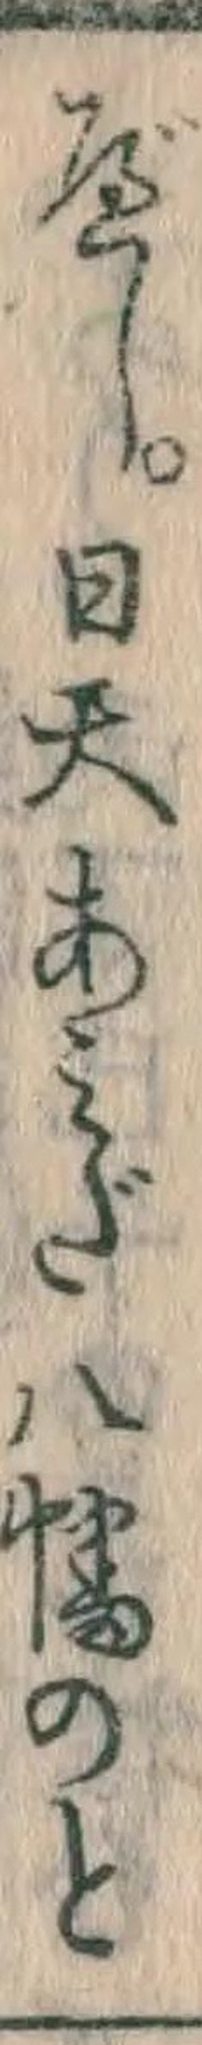べし。日天あみだ八幡のと
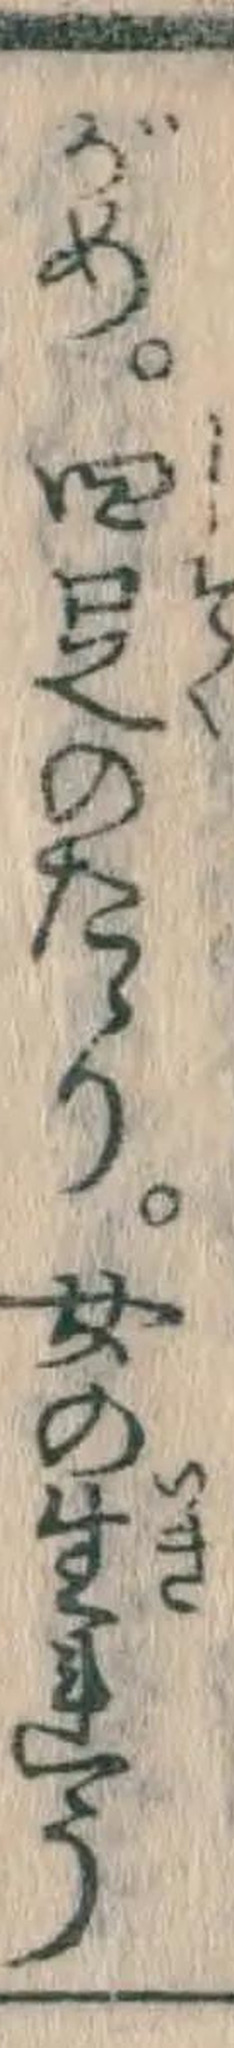がめ。四足のたゝり。女の生れう
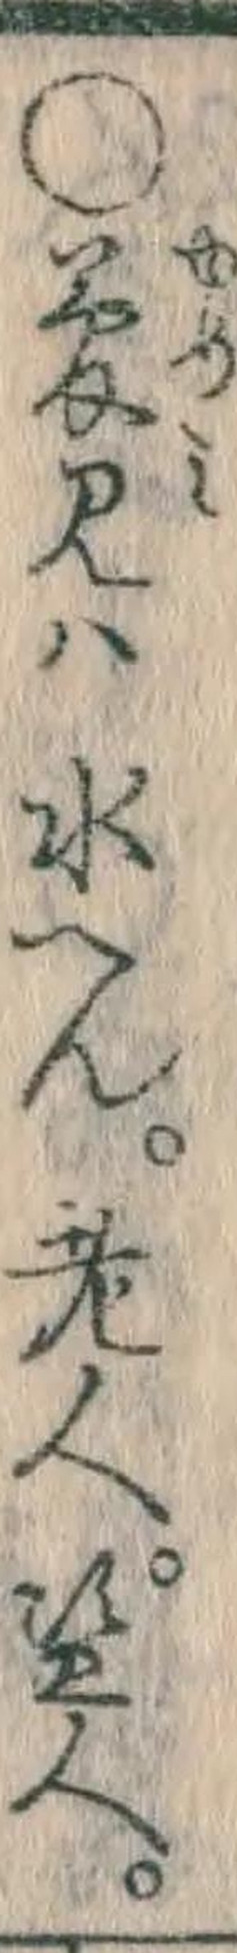○夢見は水へん。老人。盗人。
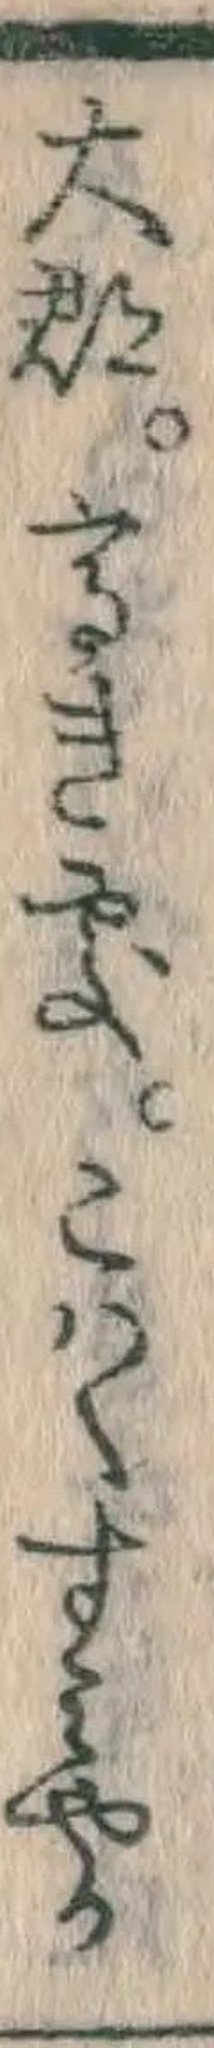大郡。高き処。こはゝすみやか
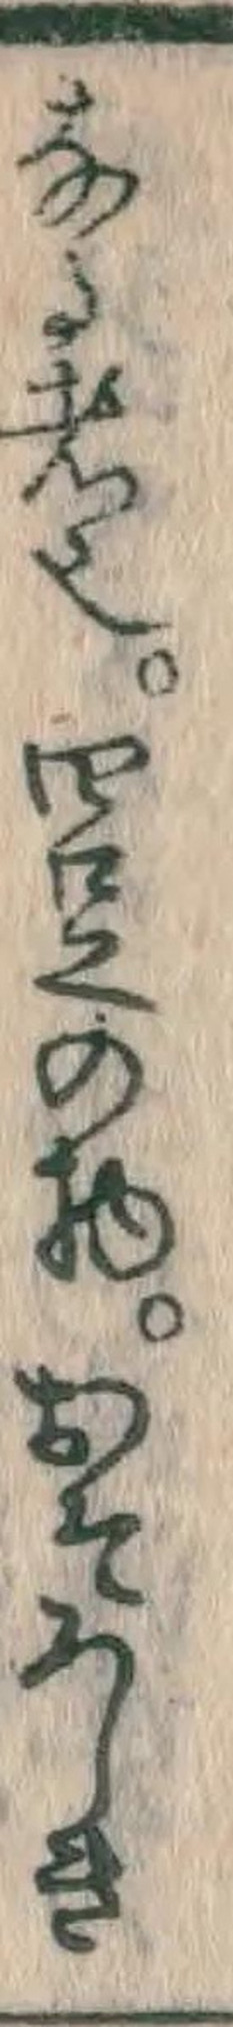なる者也。四足の物。おそろしき
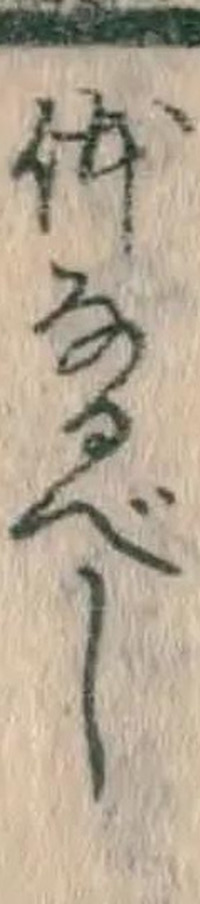体なるべし
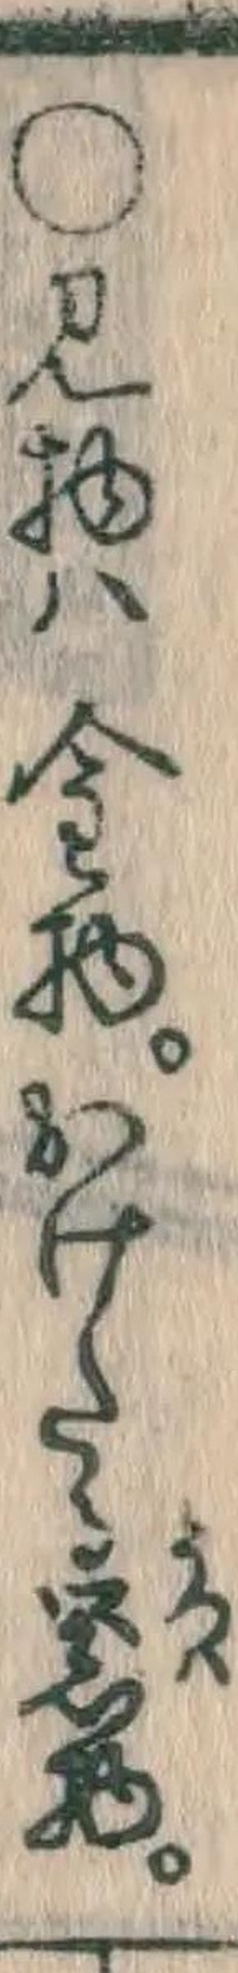○見物は金物。かけたる器物。
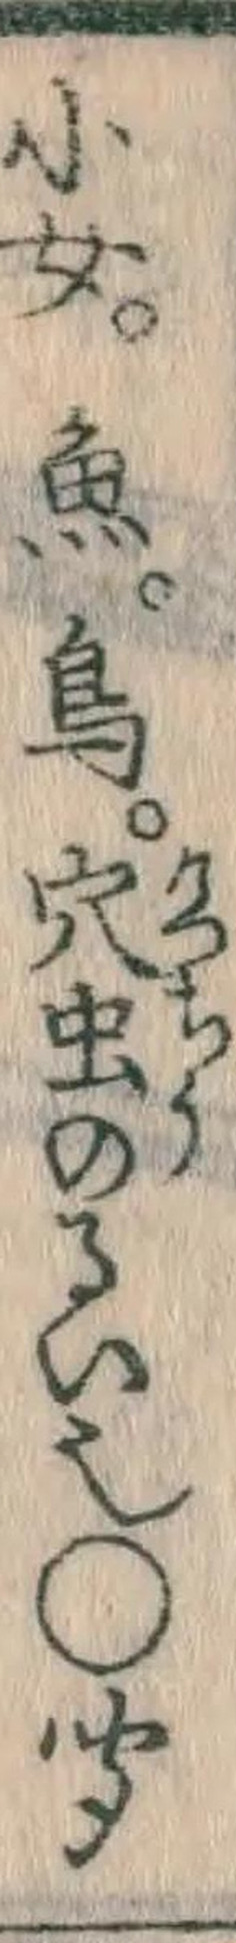小女。魚。鳥。穴虫のるい也○聞
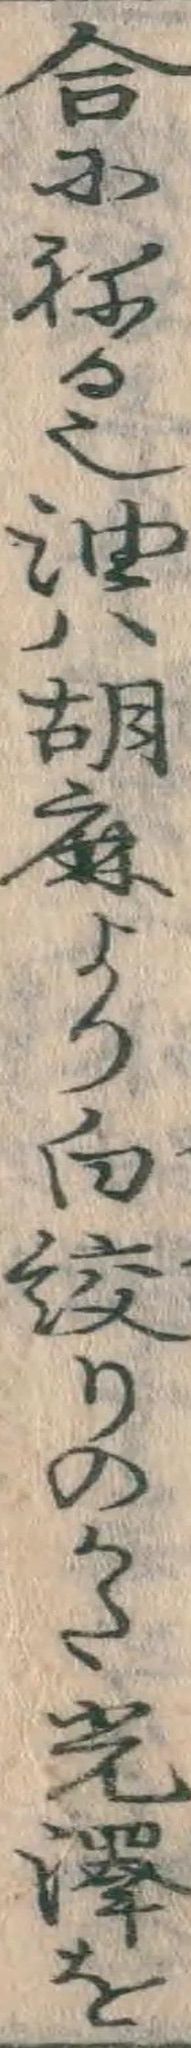合にねる也油は胡麻より白絞りのかた光沢を
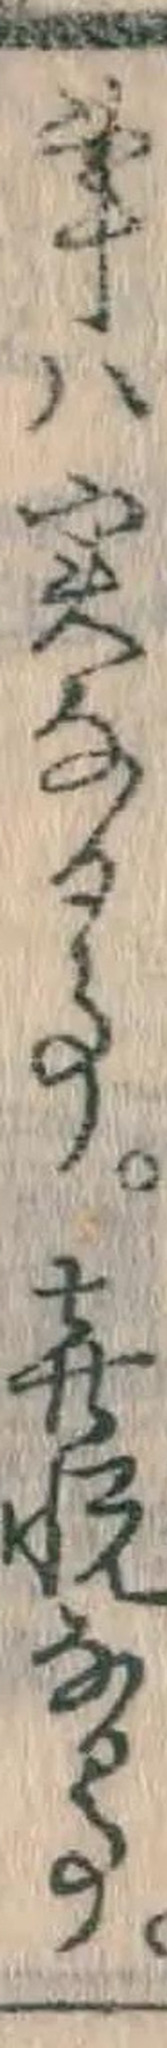事は実なる事。喜悦なる事。
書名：広益秘事大全 3巻. [1]
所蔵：国立国会図書館 National Diet Library, JAPAN
